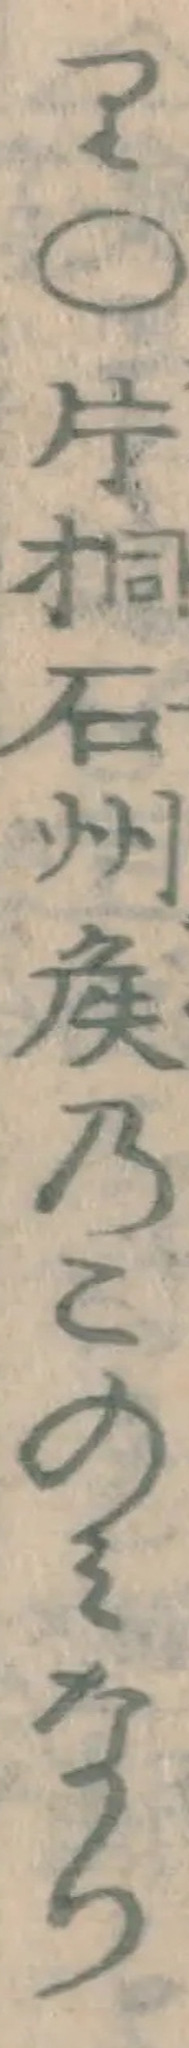り○片桐石州侯のこのみなり
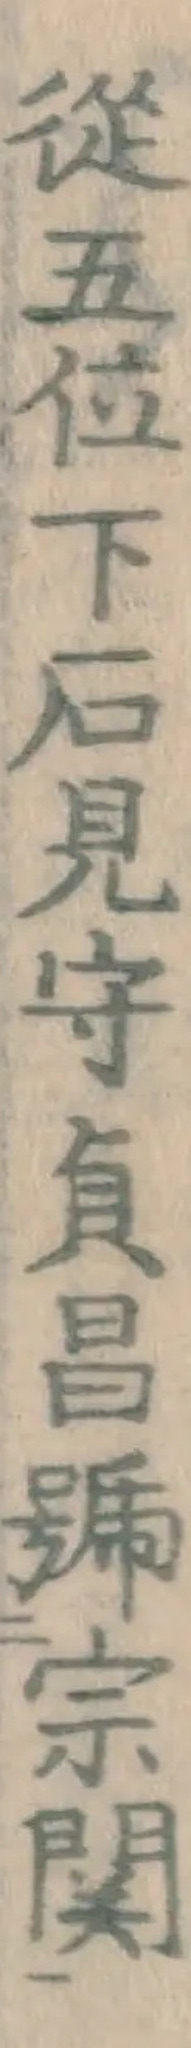従五位下石見守貞昌号宗関
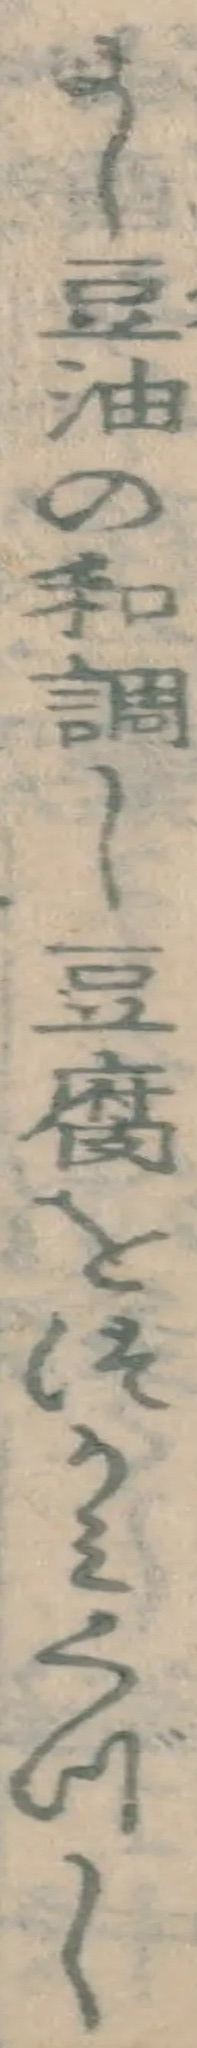にし豆油の和調し豆腐をつかみくつし
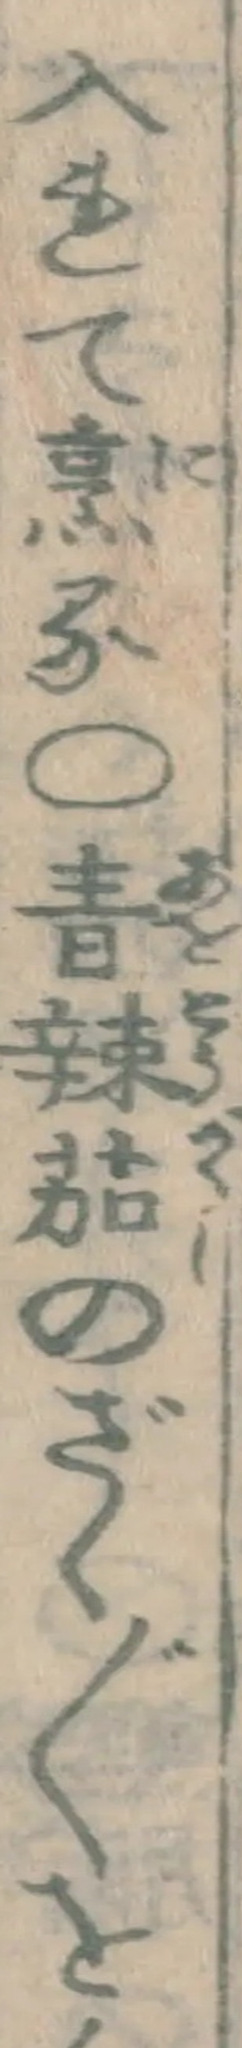入れて烹る○青辣茄のざく〳〵をく

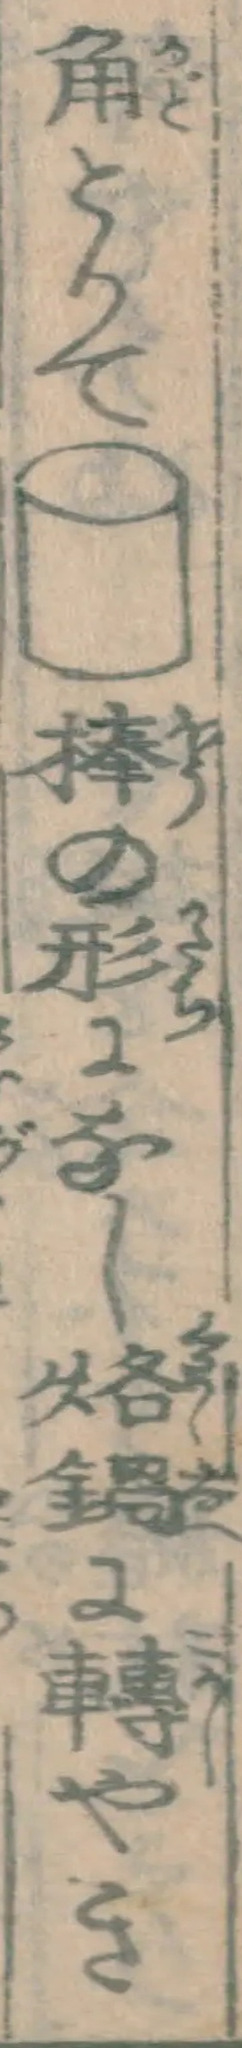角とりて棒の形になし烙鍋に転やき
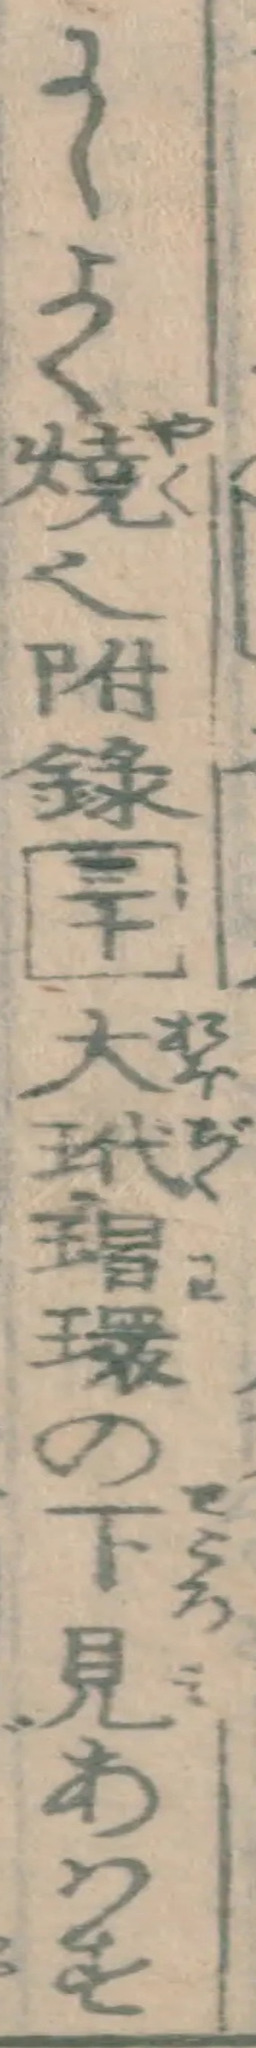にしよく焼也附録三十大玳琩環の下見あはす
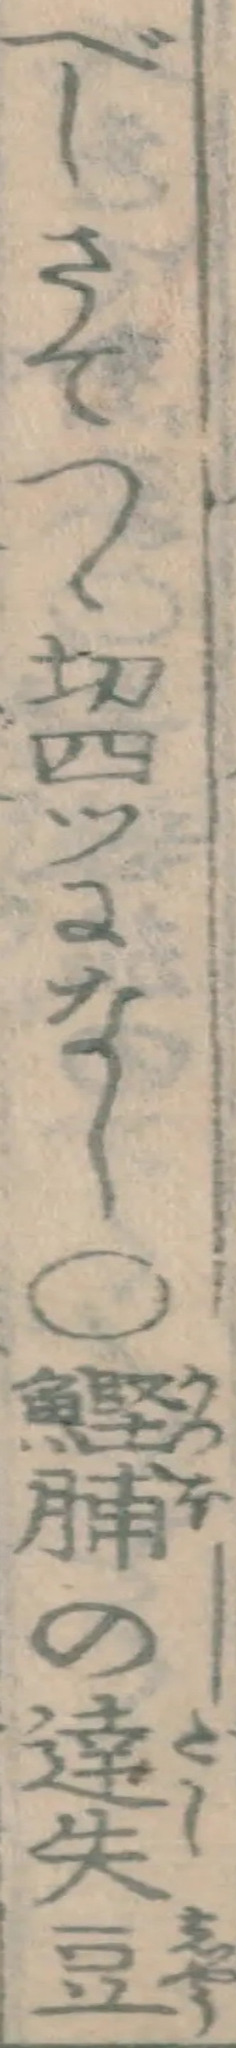べしさてつゝ切四つになし○鰹脯の達失豆
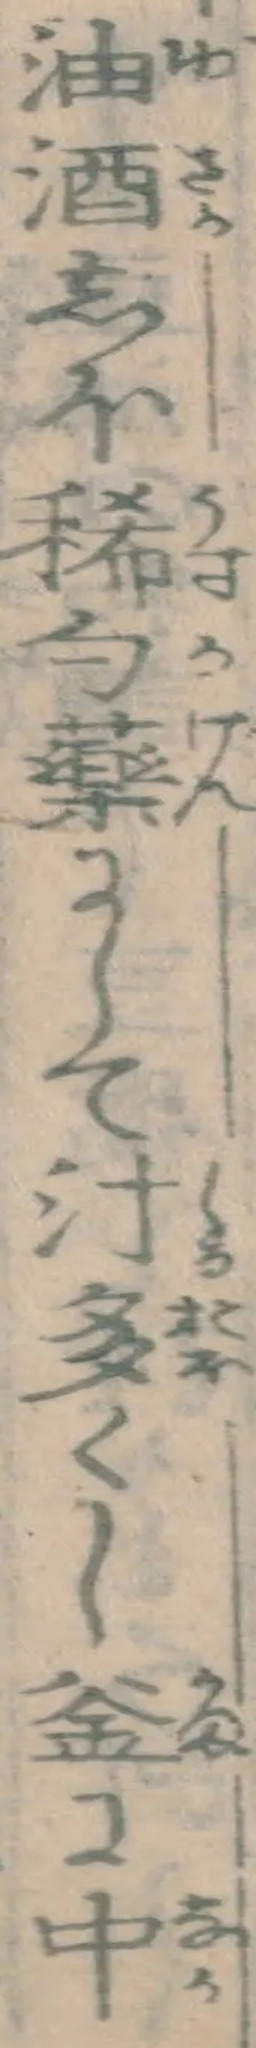油酒しほ稀勺薬にして汁多くし釜に中
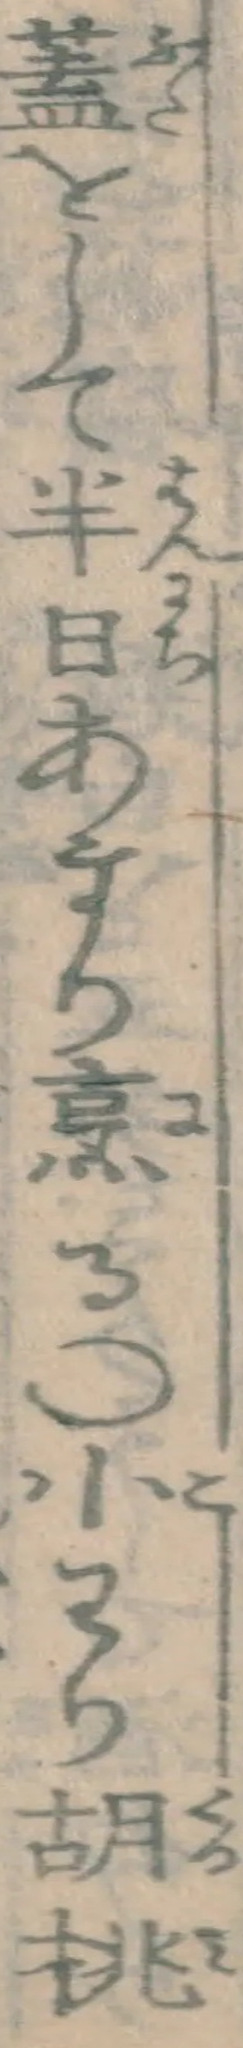蓋をして半日あまり烹る○小わり胡桃
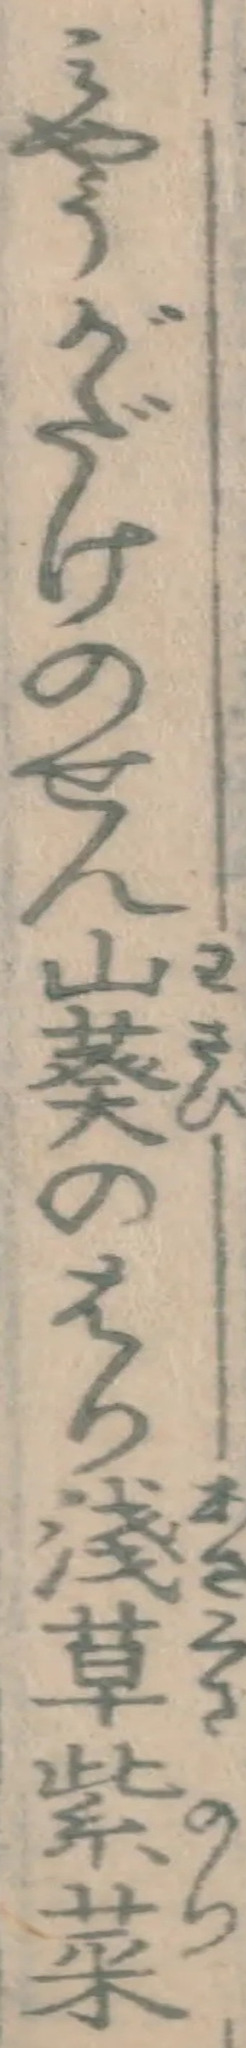みやうがだけのせん山葵のはり浅草紫菜
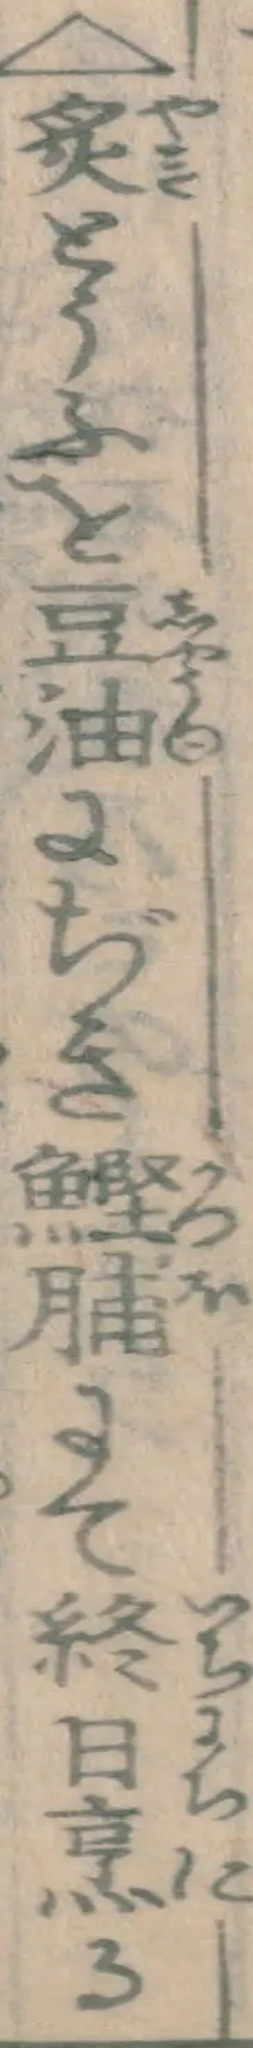△炙とうふを豆油にぢき鰹脯にて終日烹る
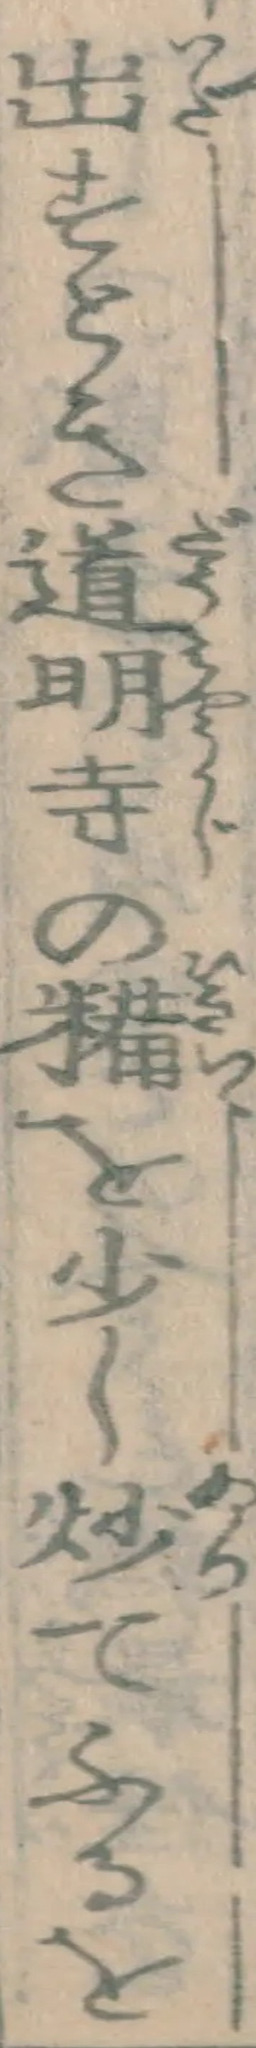出すとき道明寺の糒を少し炒てふるを
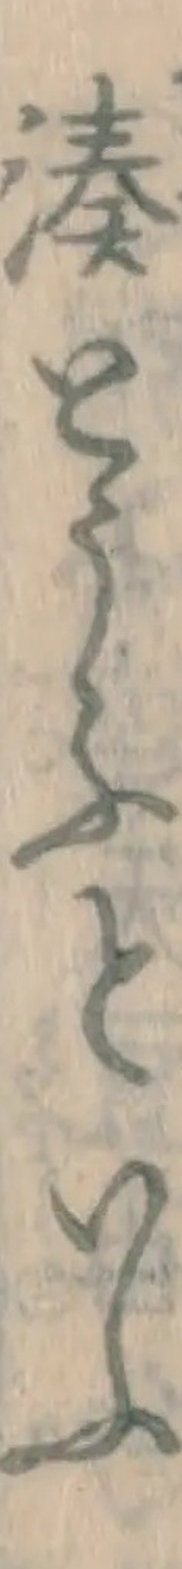湊とうふといふ
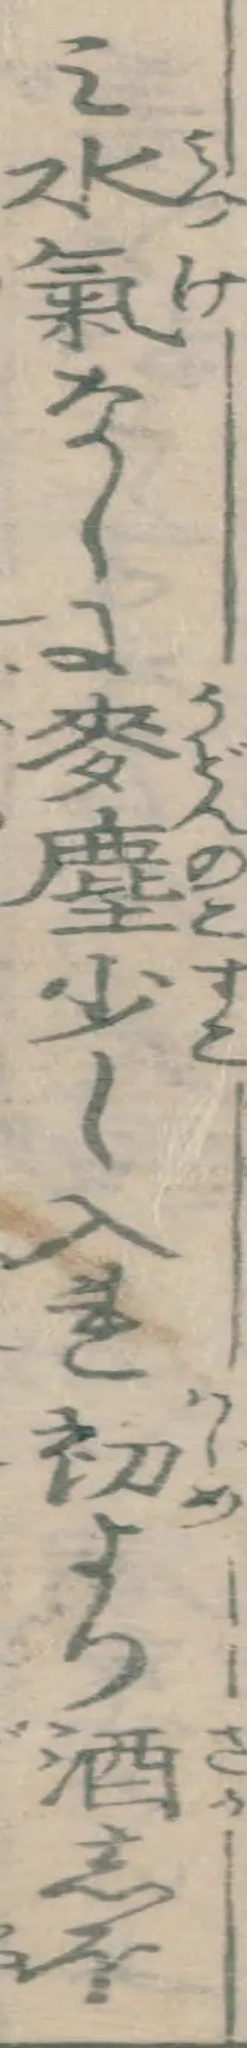み水気なしに麦塵少し入れ初より酒しほ
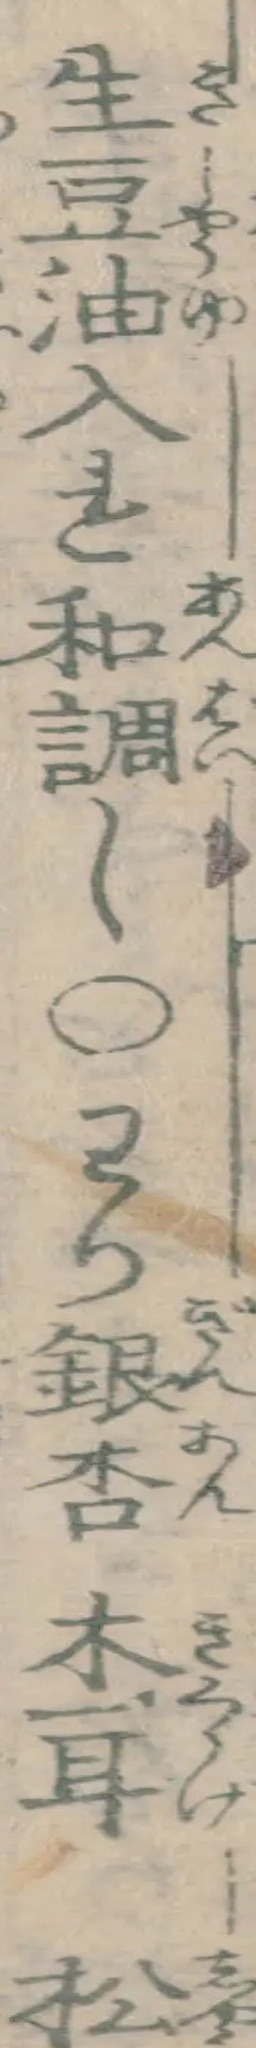生豆油入れ和調し○わり銀杏木茸松
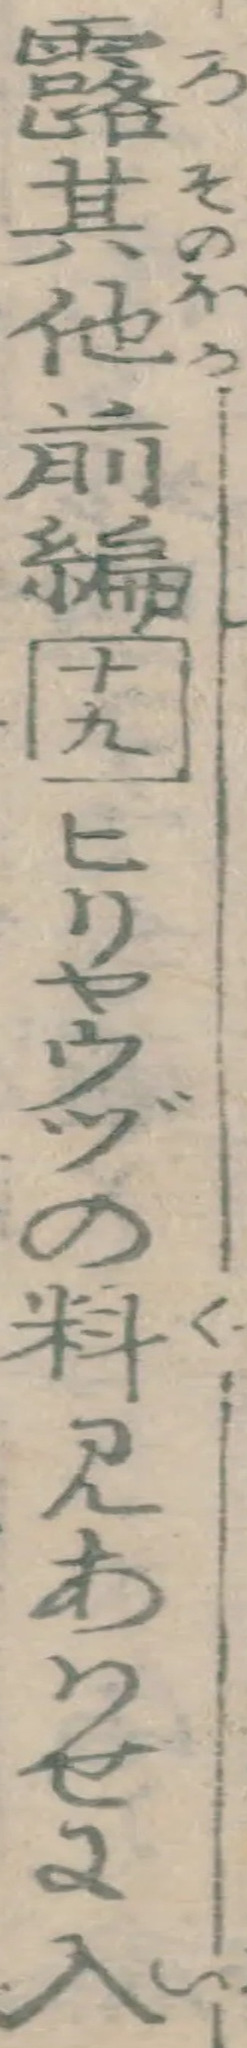露其他前編十九ヒリヤウヅの料見あはせに入
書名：豆腐百珍. 続編
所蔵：国立国会図書館 National Diet Library, JAPAN
